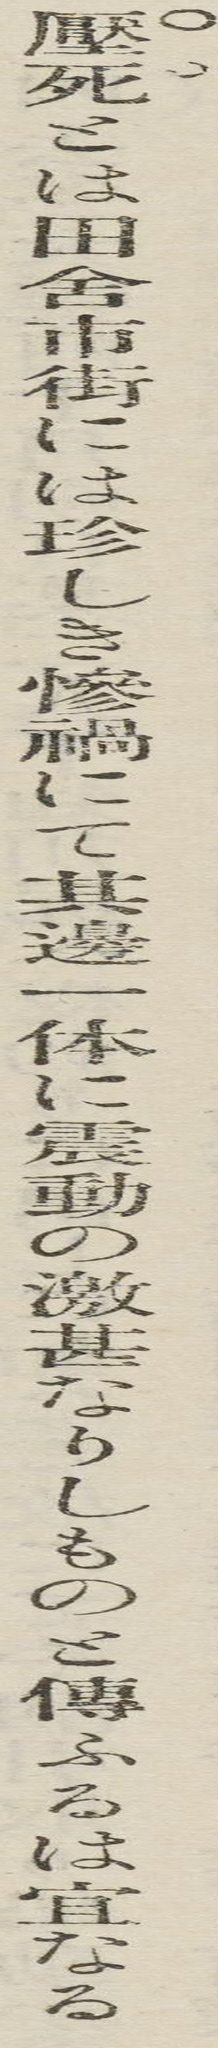圧死とは田舎市街には珍しき惨禍にて其辺一体に震動の激甚なりしものと伝ふるは宜なる
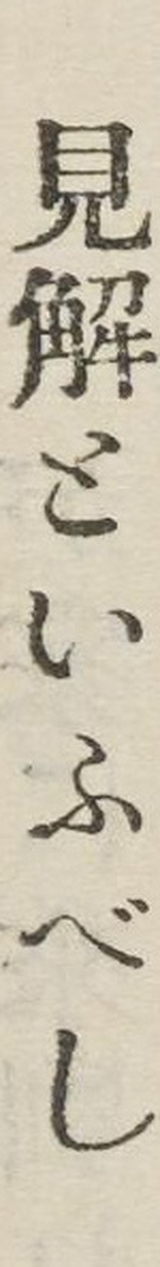見解といふべし
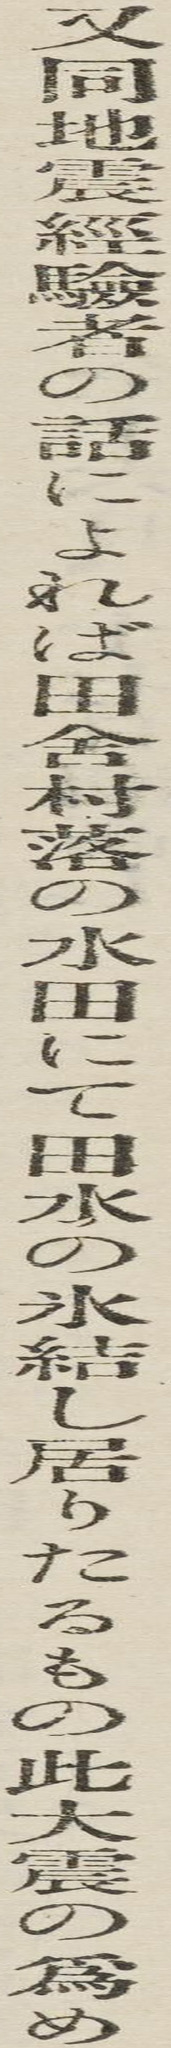又同地震経験者の話によれば田舎村落の水田にて田水の氷結し居りたるもの此大震の為め
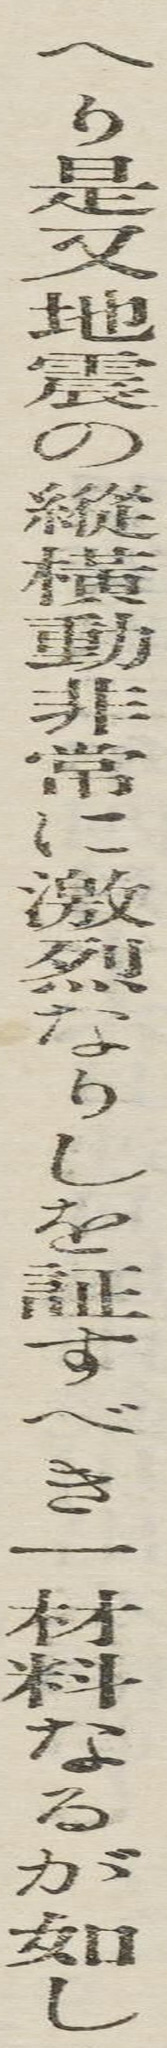へり是又地震の縦横動非常に激烈なりしを証すべき一材料なるが如し
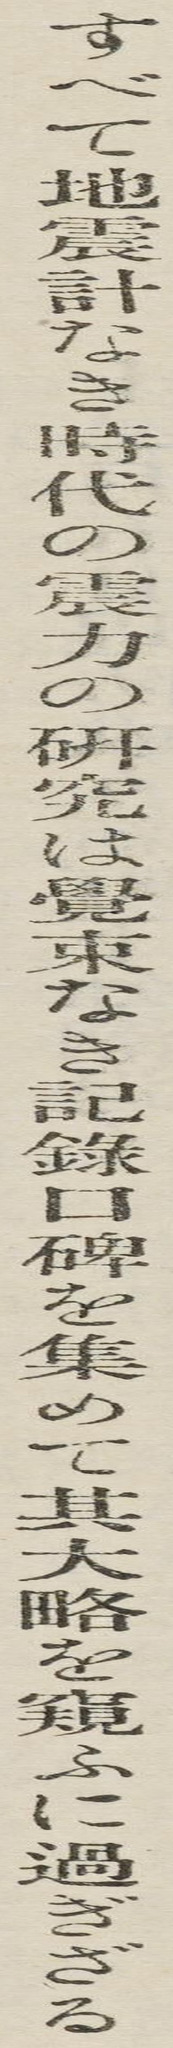すべて地震計なき時代の震力の研究は覚束なき記録口碑を集めて其大略を窺ふに過ぎざる
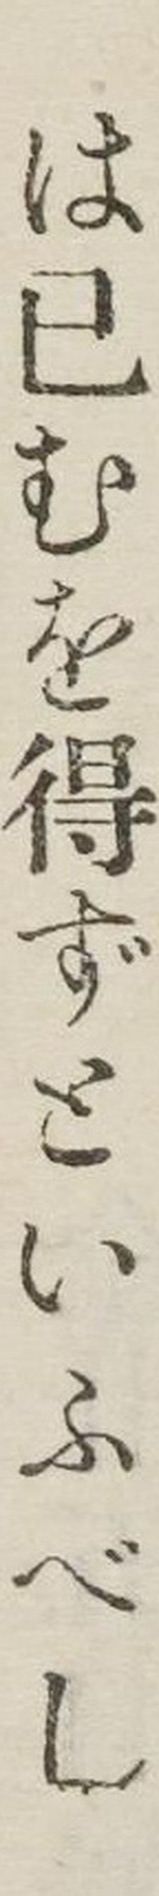は已むを得ずといふべし
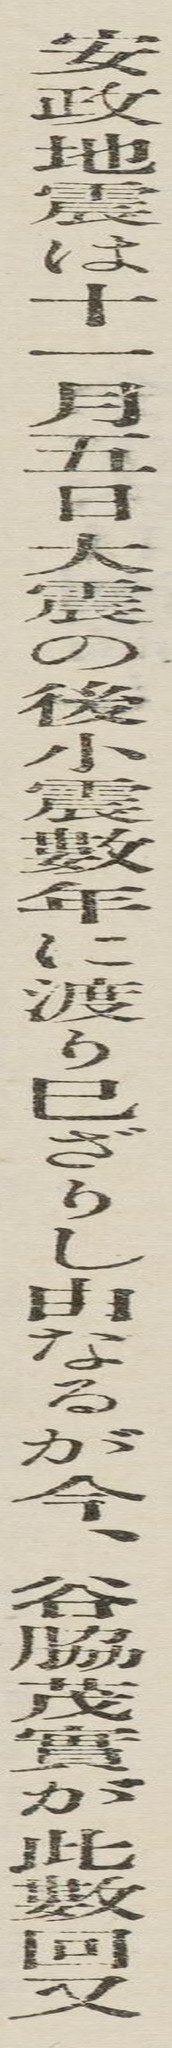安政地震は十一月五日大震の後小震数年に渡り已ざりし由なるが今、谷脇茂実が此数回又
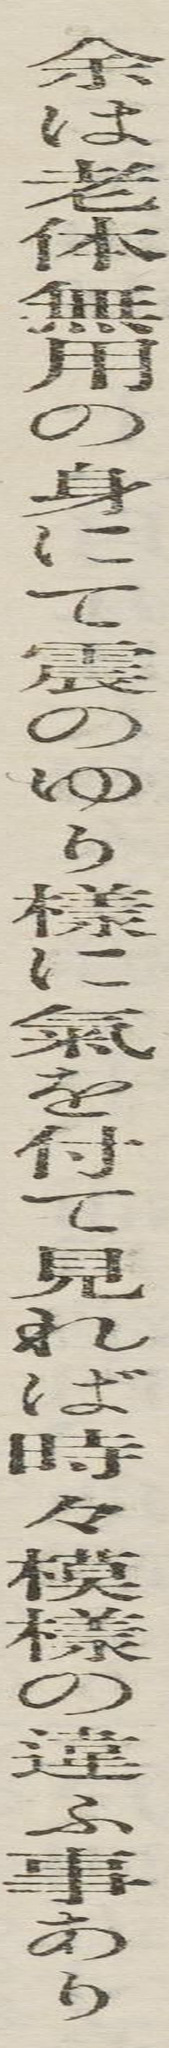余は老体無用の身にて震のゆり様に気を付て見れば時々模様の違ふ事あり
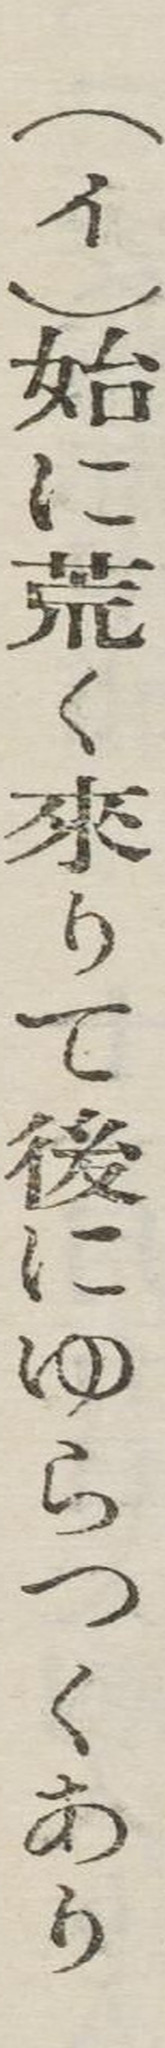始に荒く来りて後にゆらつくあり
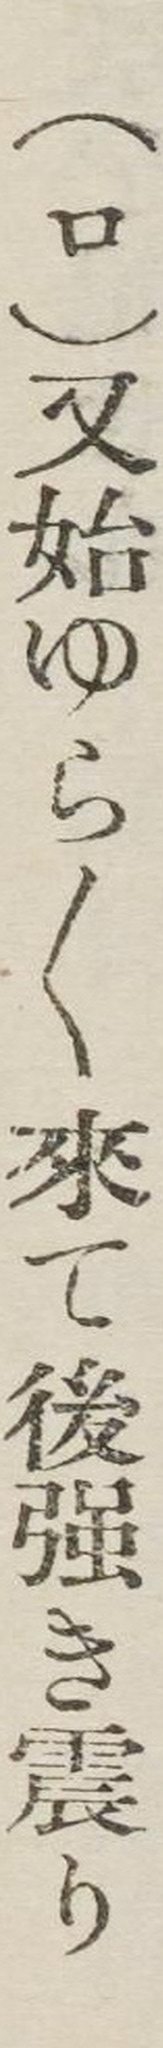又始ゆら〳〵来て後強き震り
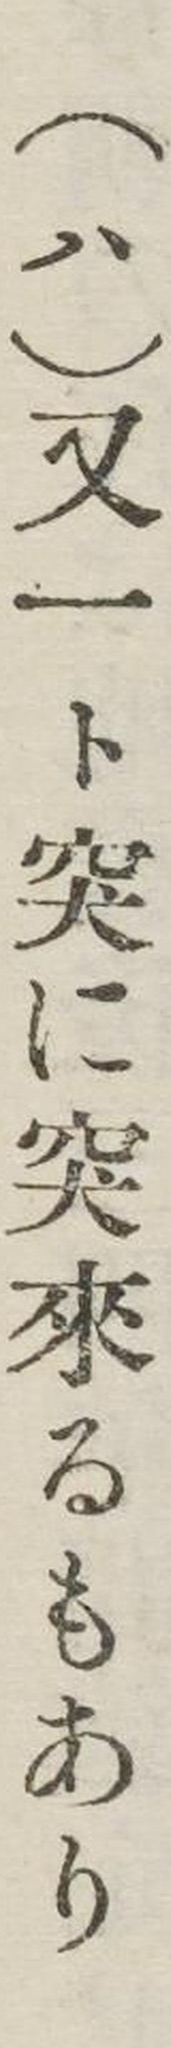又一ト突に突来るもあり
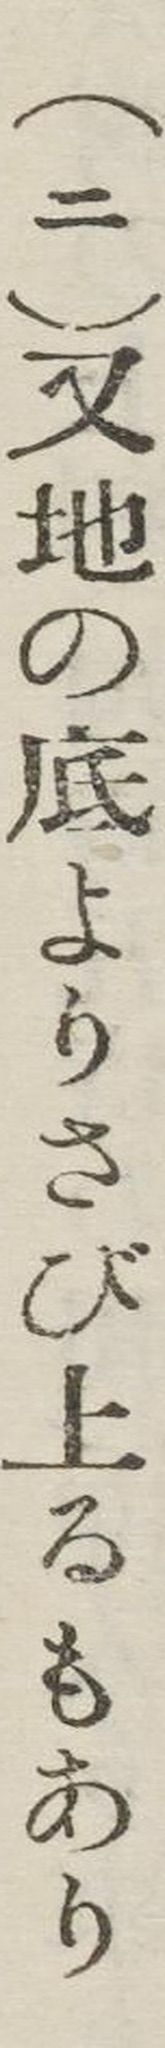又地の底よりさび上るもあり
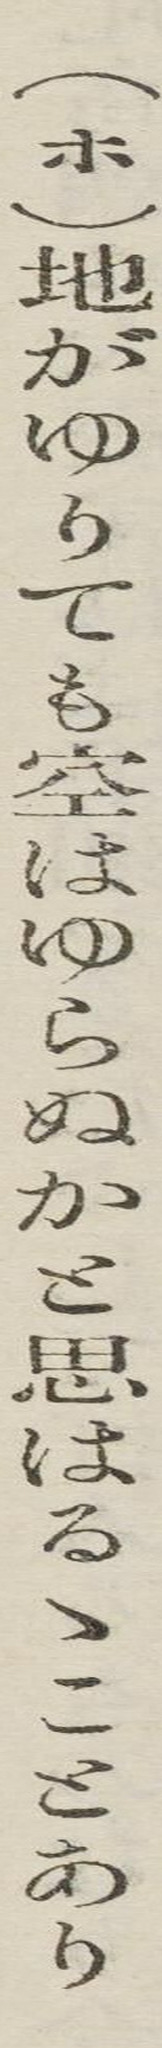地がゆりても空はゆらぬかと思はるゝことあり
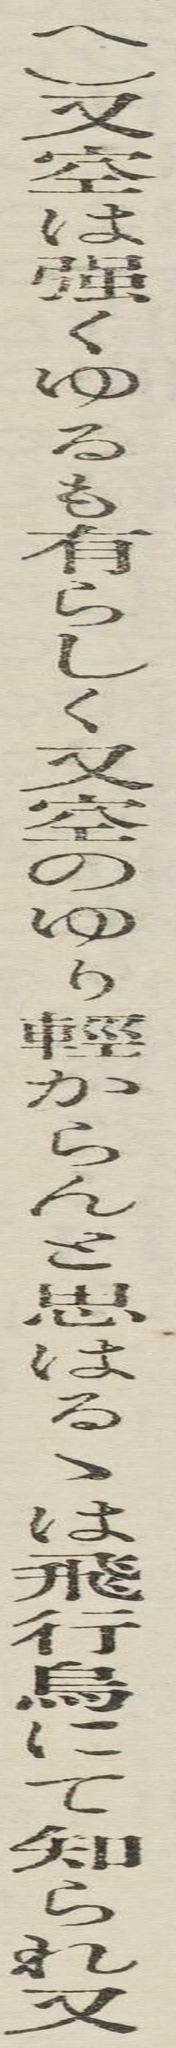又空は強くゆるも有らしく又空のゆり軽からんと思はるゝは飛行鳥にて知られ又
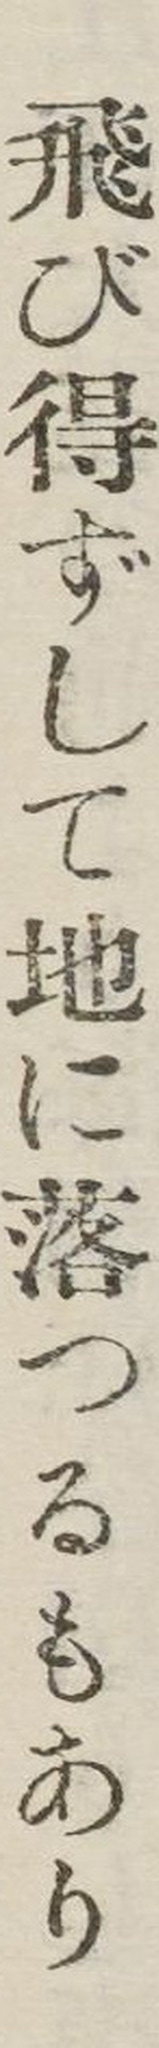飛び得ずして地に落つるもあり
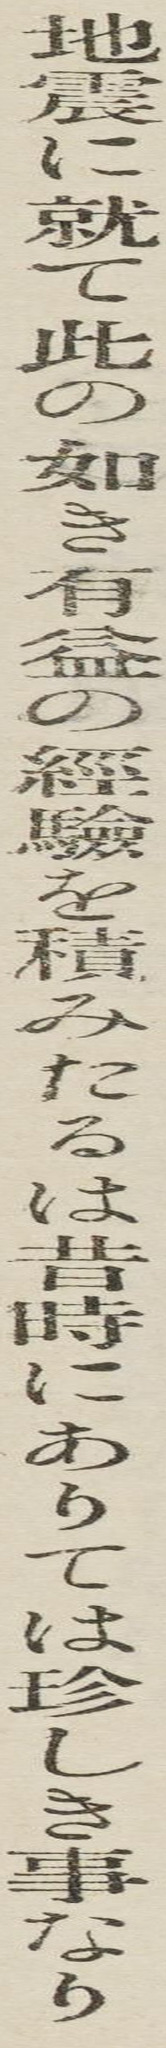地震に就て此の如き有益の経験を積みたるは昔時にありては珍しき事なり
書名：土佐古今ノ地震
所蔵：東京大学地震研究所図書室 Earthquake Research Institute Library, The University of Tokyo, JAPAN
